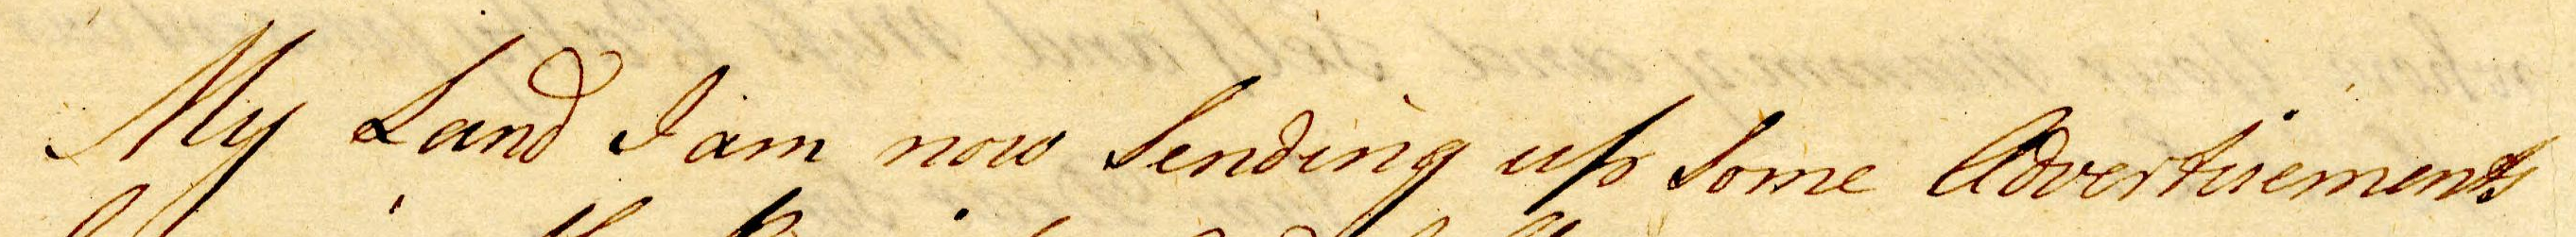My Land I am now Sending up some Advertisements
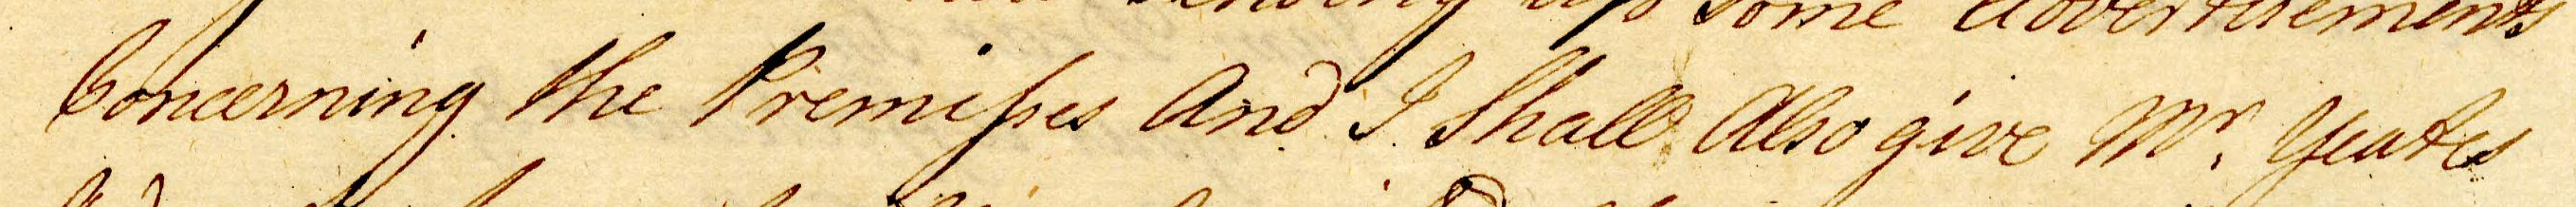Concerning the Premisses And I Shall Also give M^r. Yeates
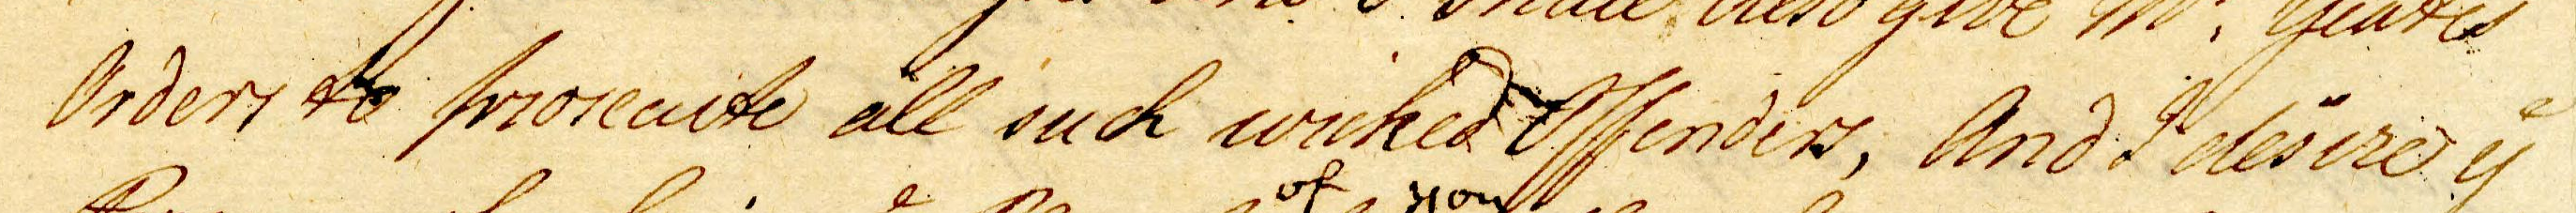Orders to prosecute all such wicked Offenders, And I desire y^e
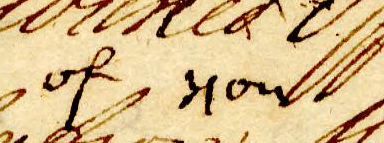of you
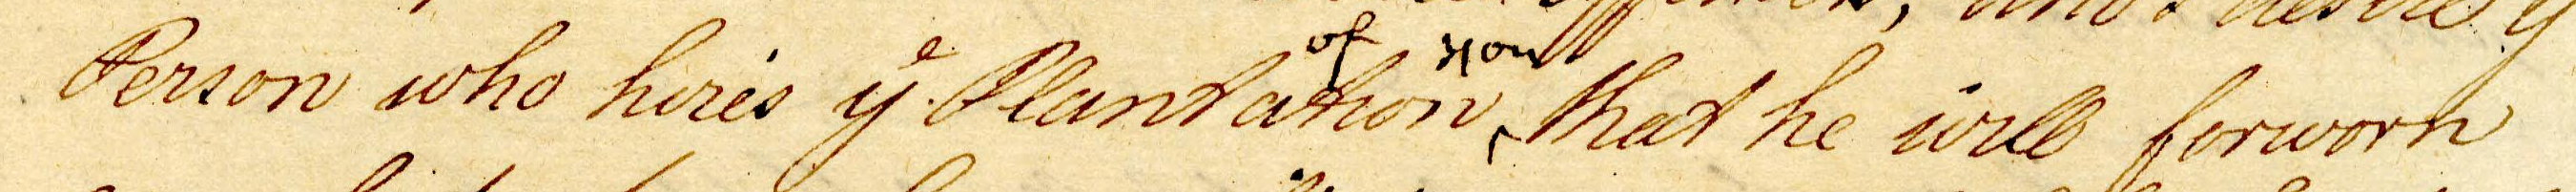Person who here's y^e Plantation ^ that he will forworn
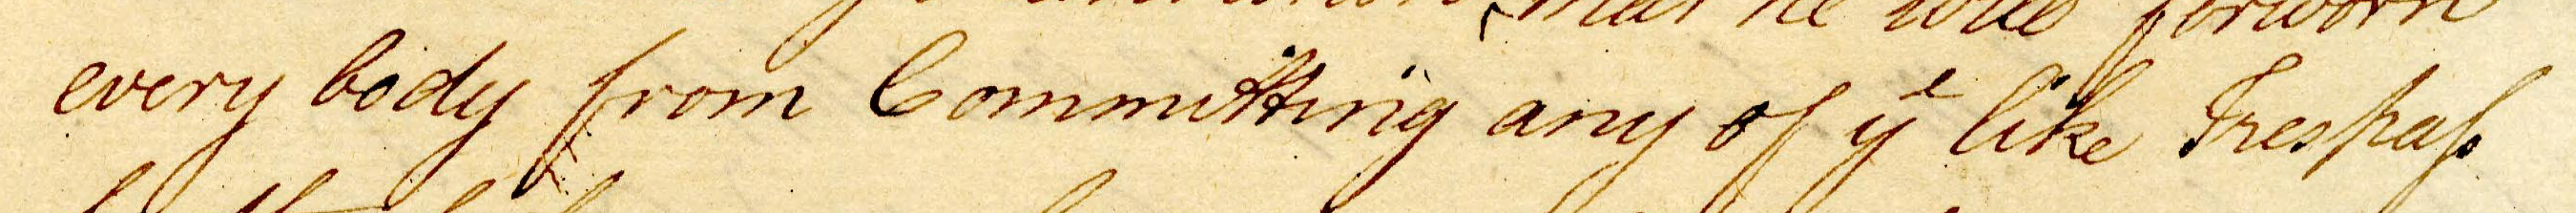every body from Committing any of y^e like Trespass
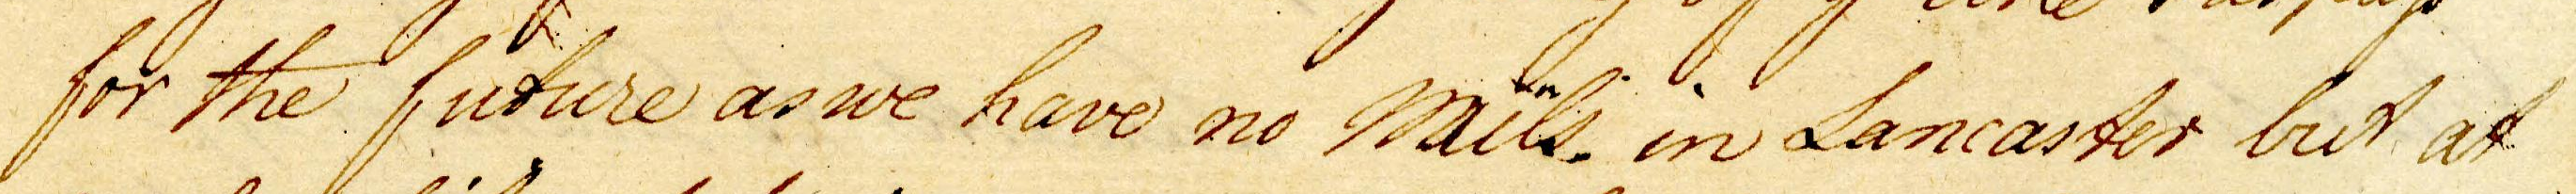for the future as we have no Mils, in Lancaster but at
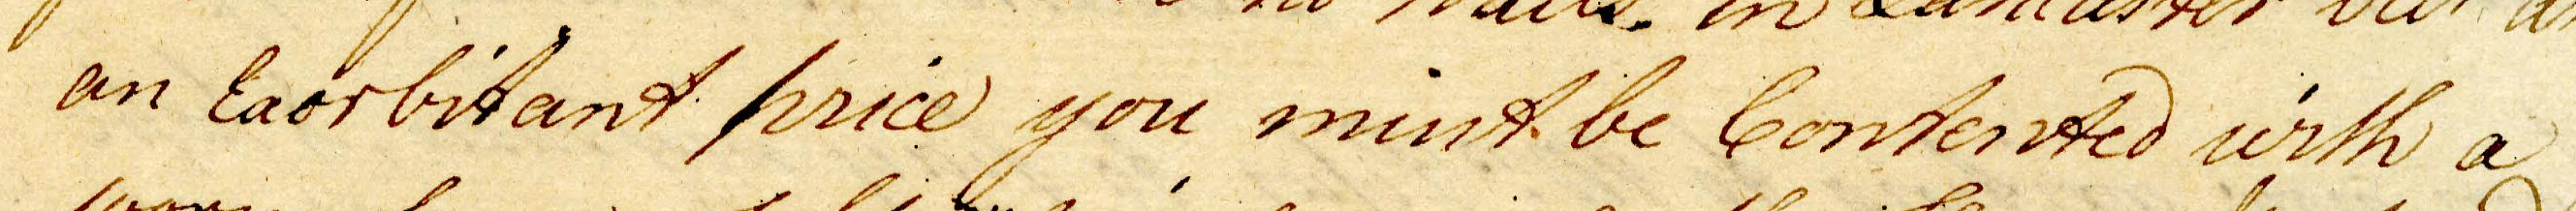an Exorbitant price you mint be Contented with a
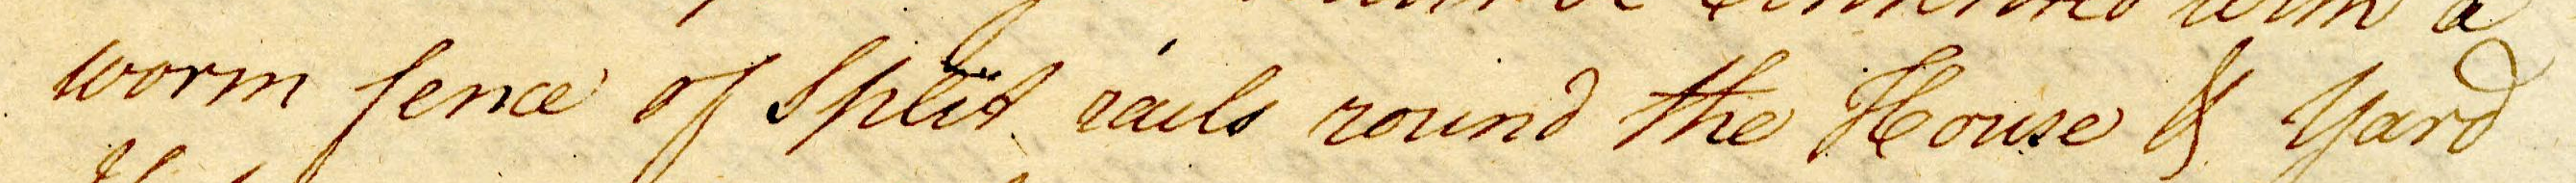worm fence of Split rails round the House & Yard
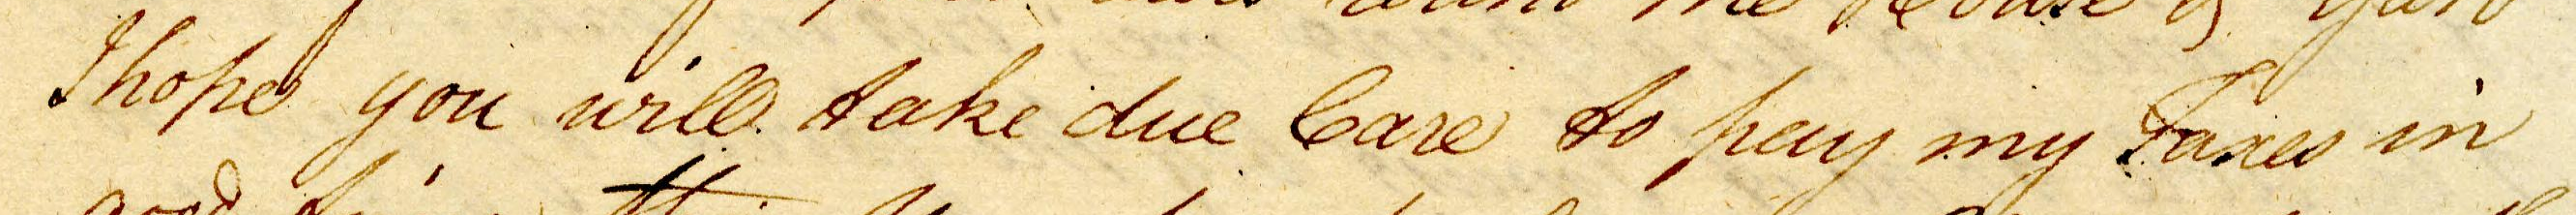I hope you will take due Care to pay my Taxes in
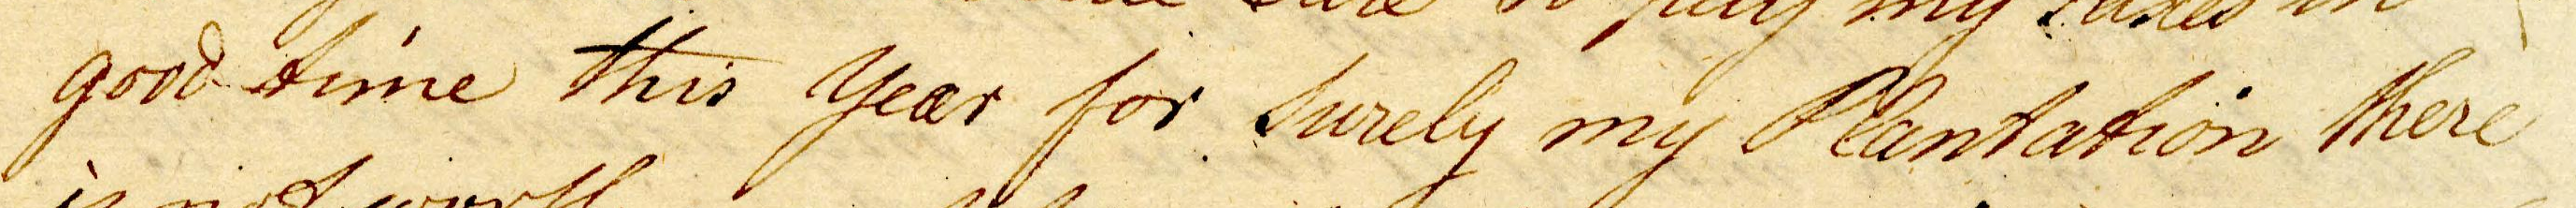good time this Year for Surely my Plantation there
